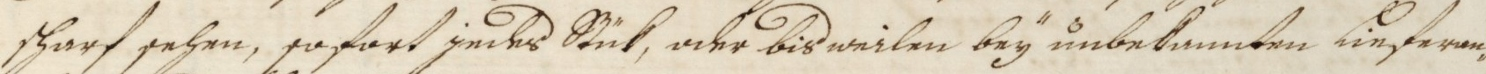scharf sehen, sofort jedes Stük, oder bisweilen bey unbekannten Lieferan-
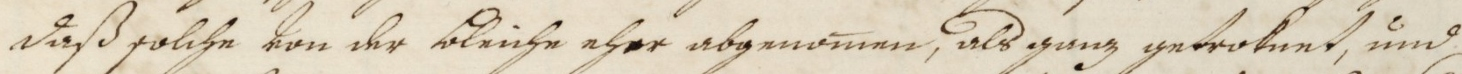daß solche von der Bleiche eher abgenommen, als ganz getroknet, und
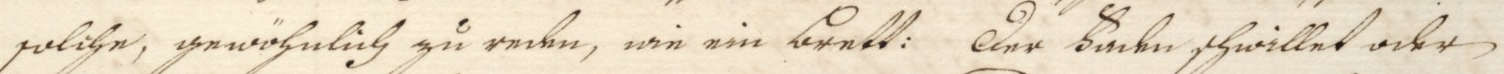solche, gewöhnlich zu reden, wie ein Brett: Der Faden schwillet oder
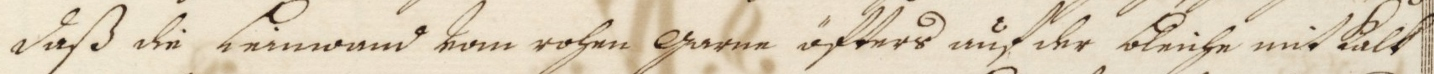daß die Leinwand vom rohen Garne öfters auf der Bleiche mit Kalk
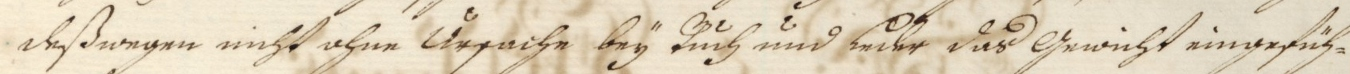deßwegen nicht ohne Ursache bey Tuch und Leder das Gewicht eingefüh-
